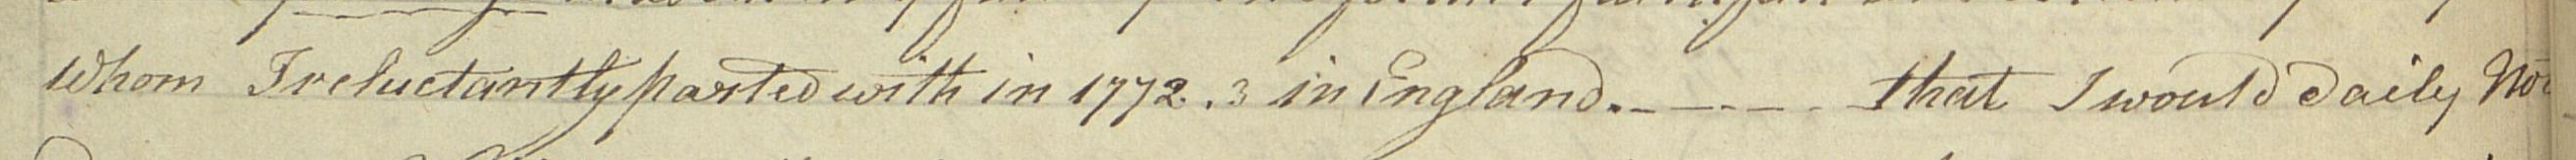whom I reluctantly parted with in 1772. 3 in England. that I would daily Not-.
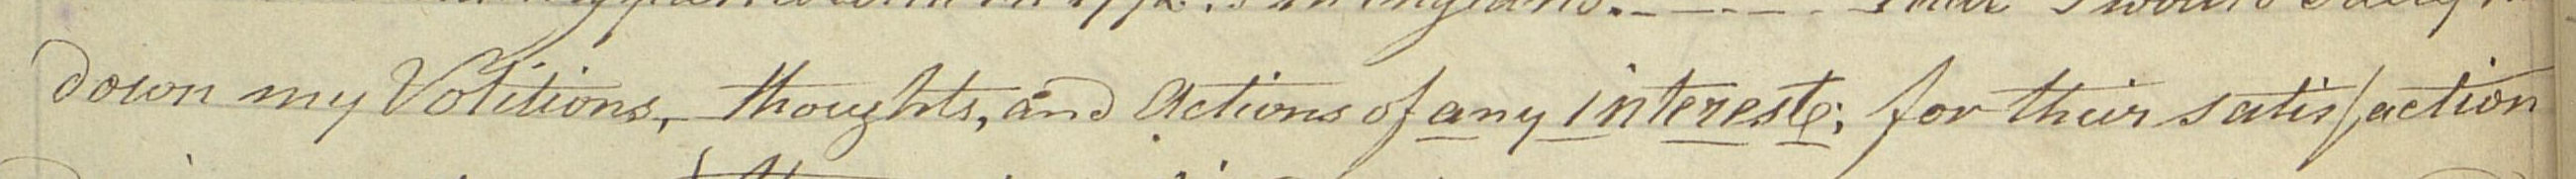down my Volitions, thoughts, and Actions of any interest for their satisfaction
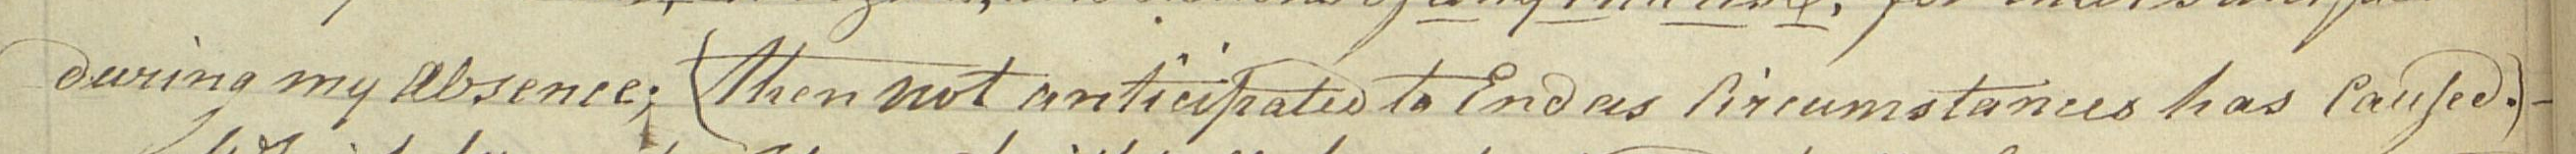during my Absence; (then not anticipated to End as Circumstances has Caused.)
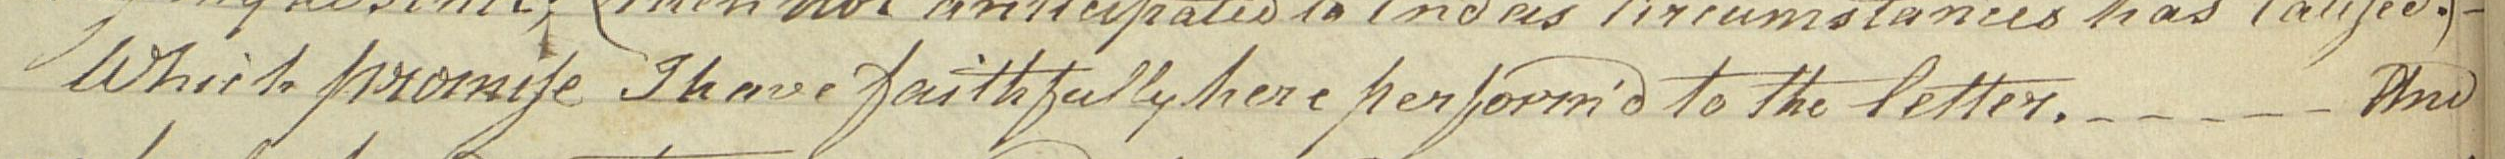Which promise I have faithfully here perform'd to the letter. And
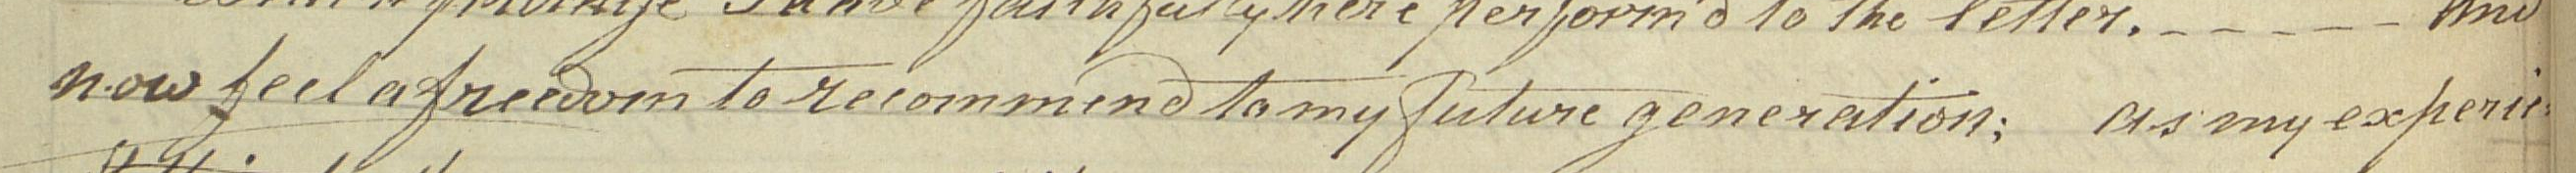now feel a freedom to recommend to my future generation; as my experie-
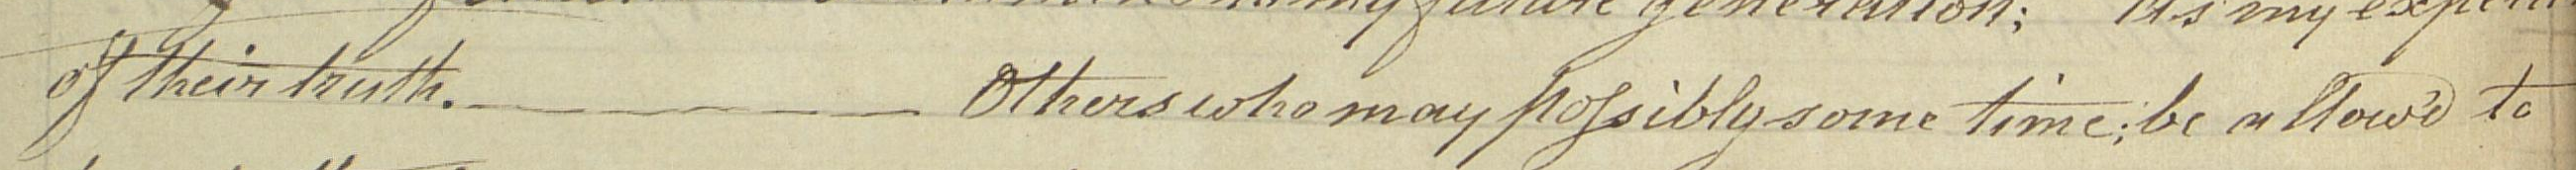of their truth. Others who may possibly some time; be allowd to
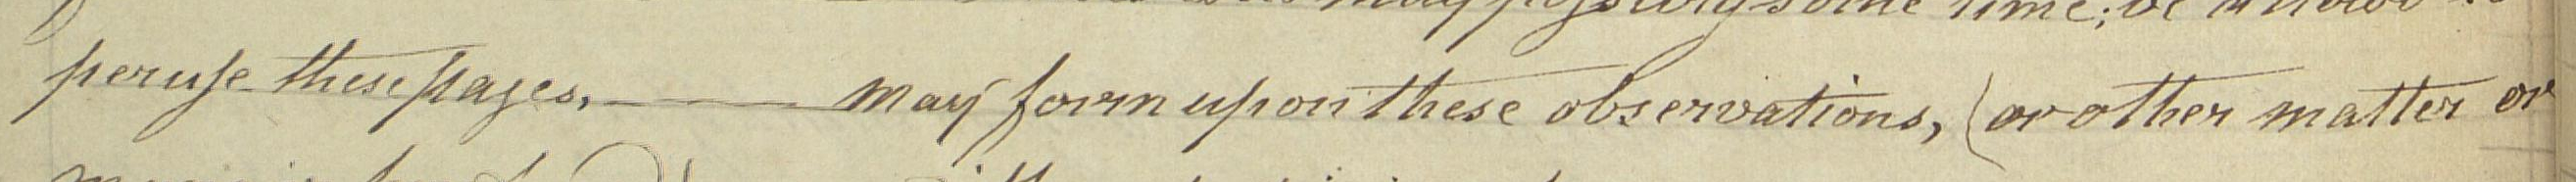peruse these pages, May form upon these observations, (or other matter or
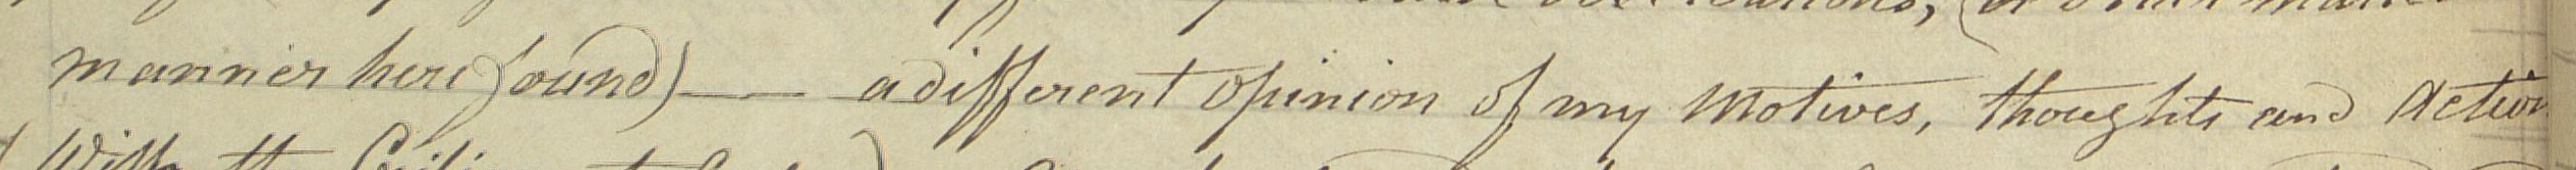manner here found) a different opinion of my Motives, thoughts and Action
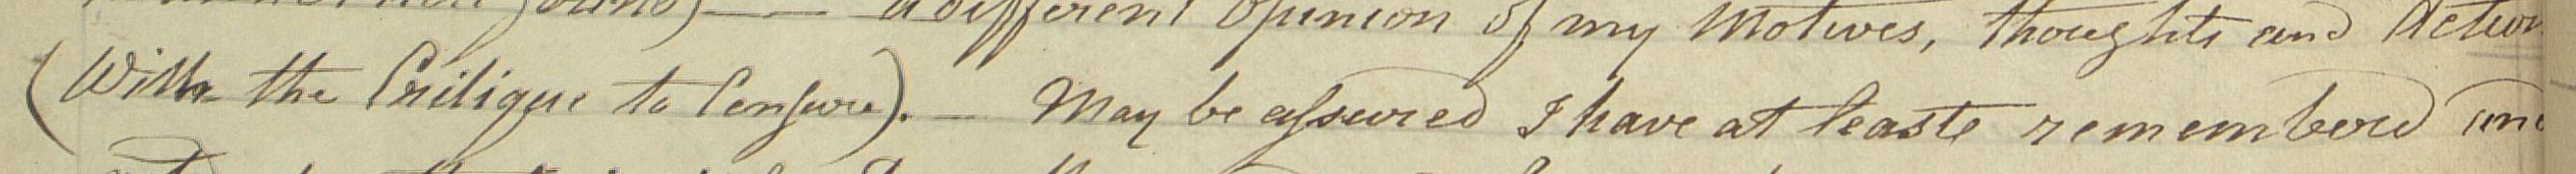(With the Critique to Censure). May be assured I have at least rememberd and
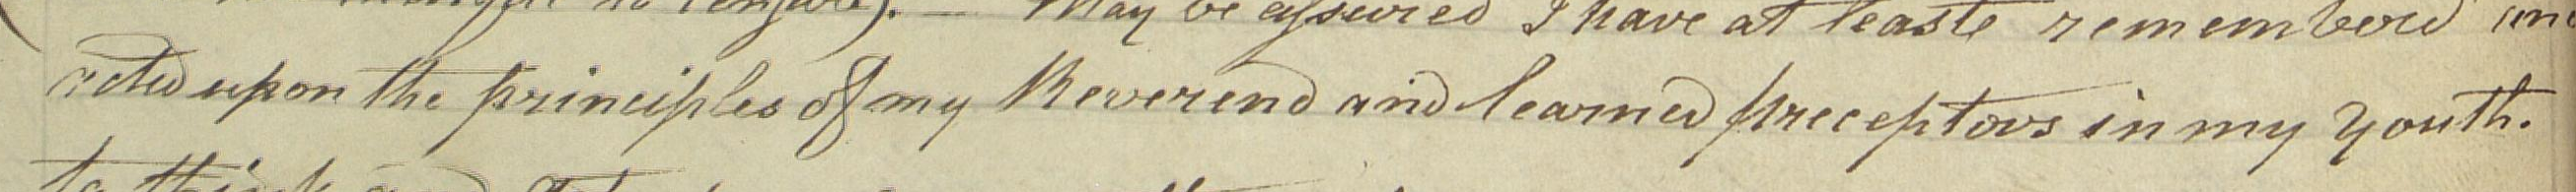acted upon the principles of my Reverend and learned preceptors in my youth
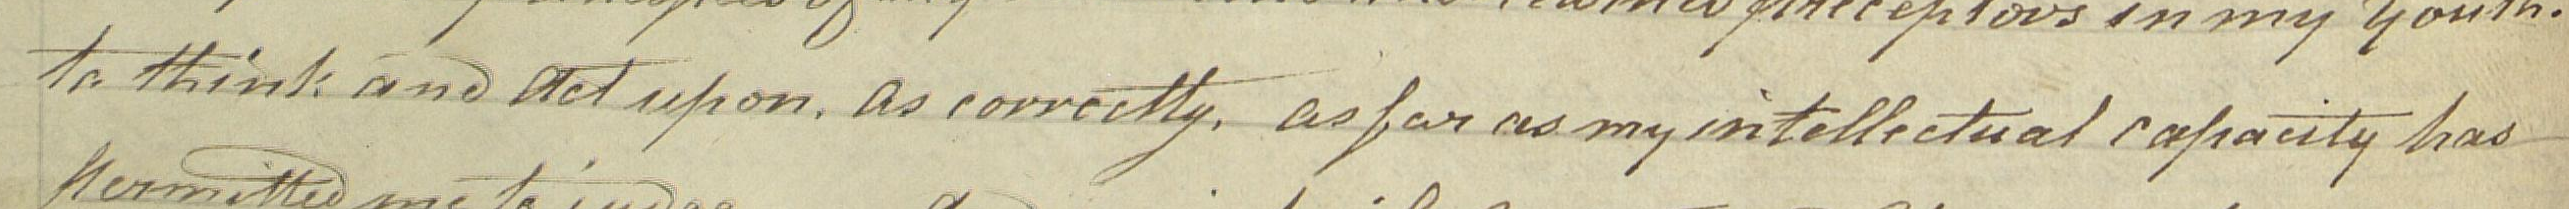to think and Act upon. as correctly, as far as my intellectual capacity has
